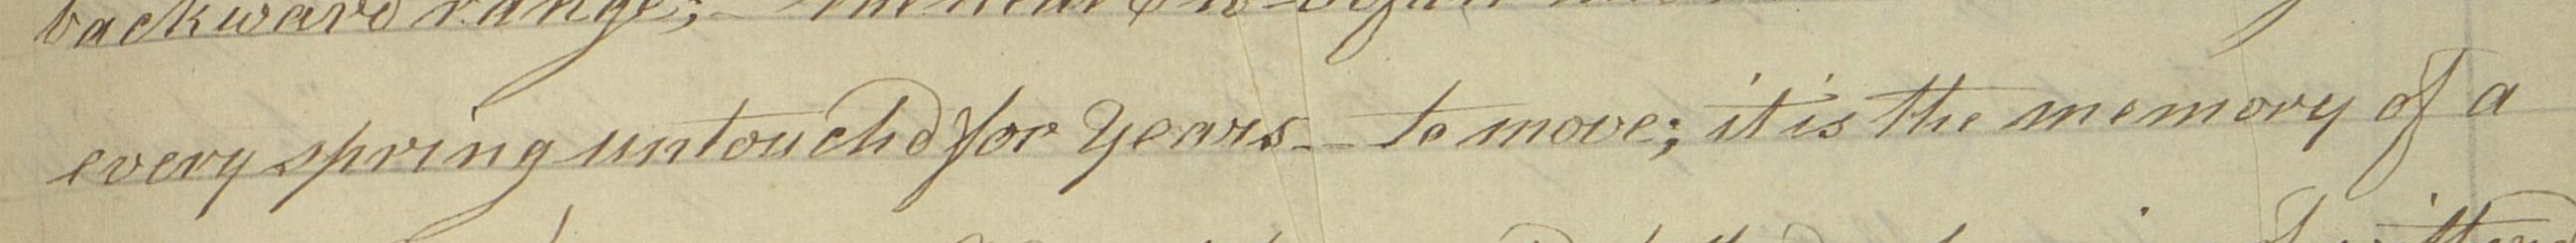every spring untouched for years, to move; it is the memory of a
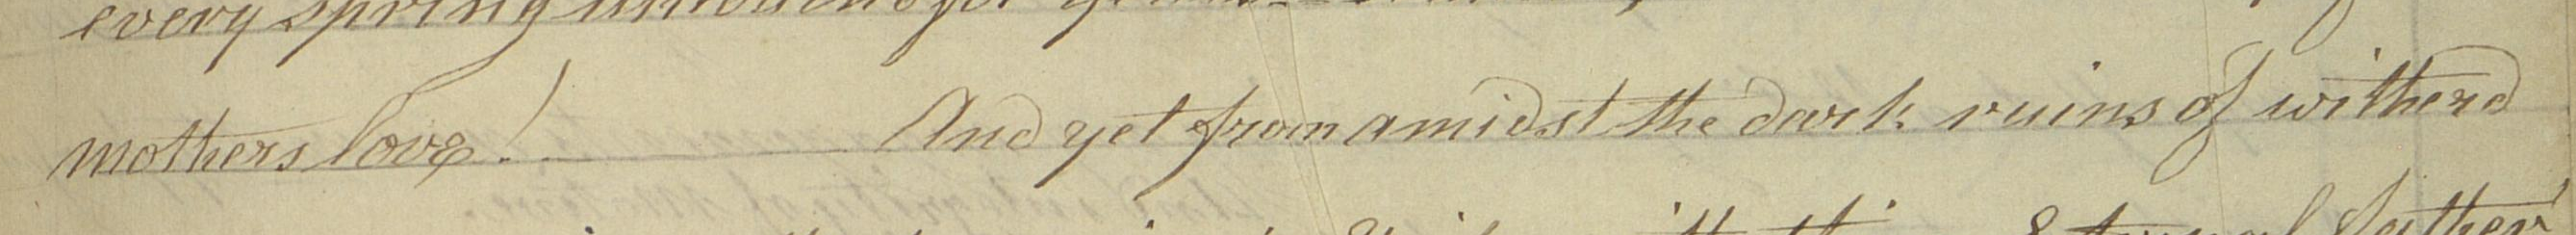mothers love! And yet from amidst the dark ruins of witherd
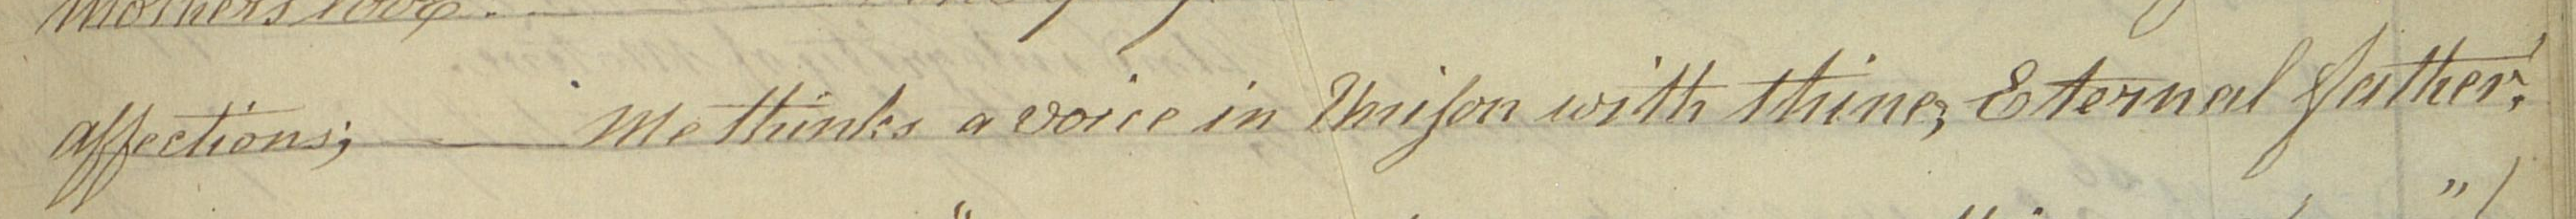Affections; We thinks a voice in Unison with thine; Eternal father:
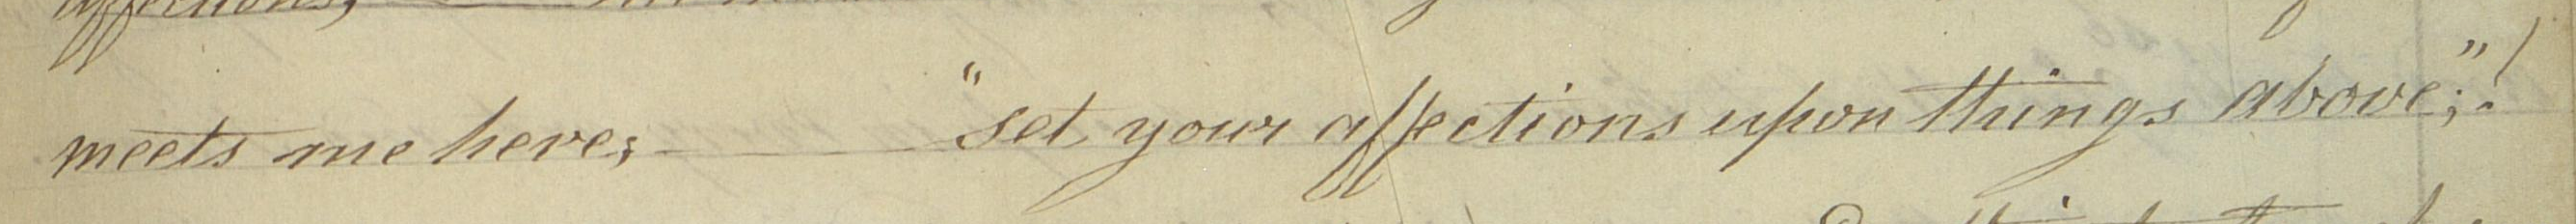meets me here; "set your affections upon things above;"!
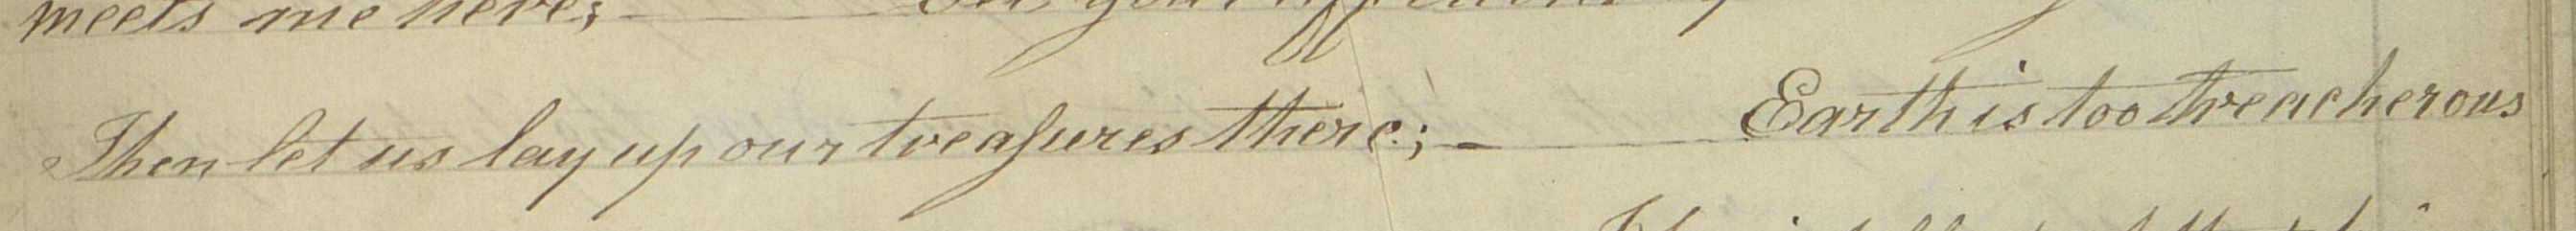Then let us lay up our treasures there; Earth is too treacherous
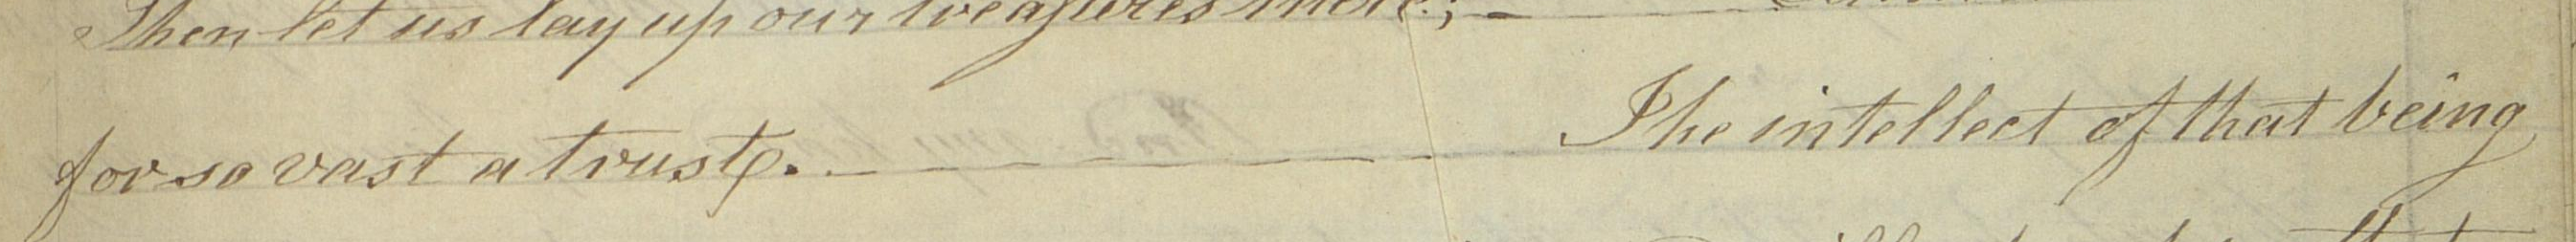for so vast a trust. The intellect of that being
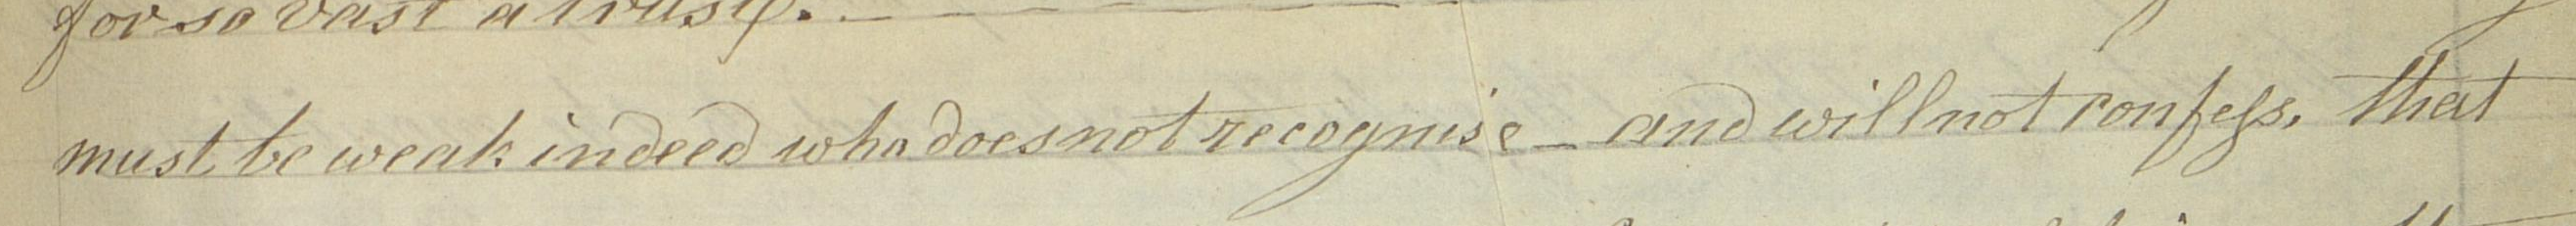must be weak indeed who does not recognise, and will not confess, that
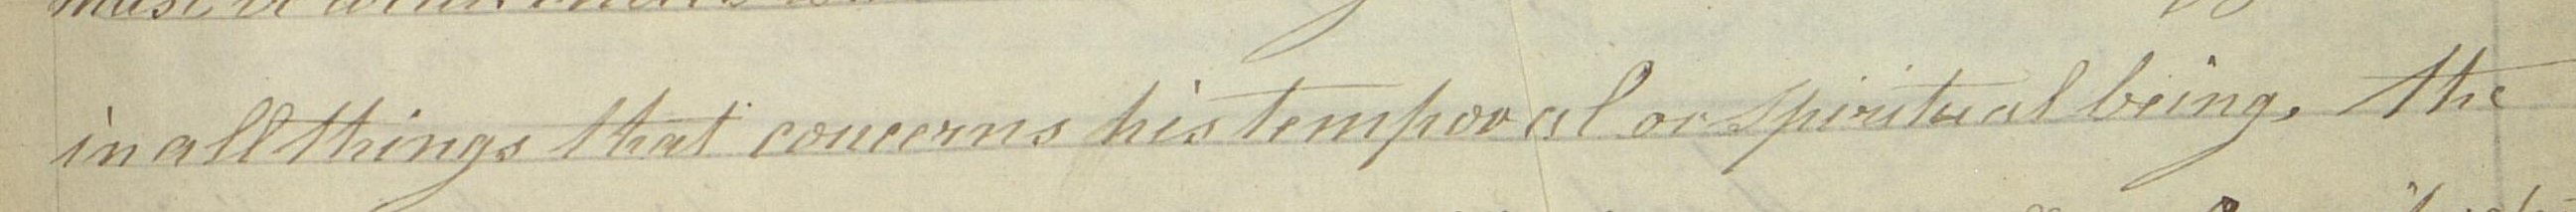in all things that concerns his temporal or spiritual being, the
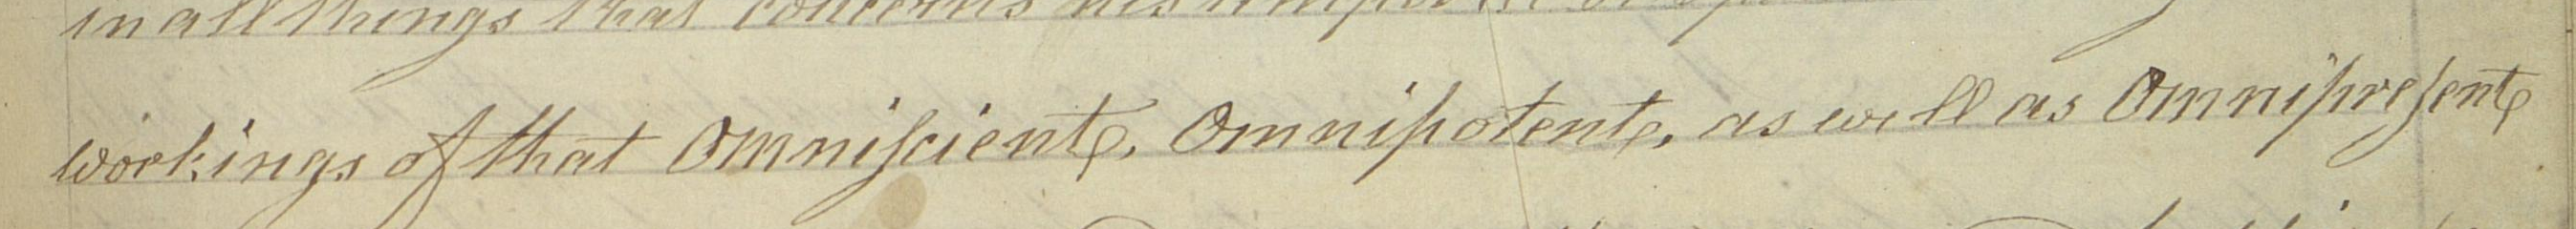workings of that omniscient Omnipotent, as well as Omnipresent
